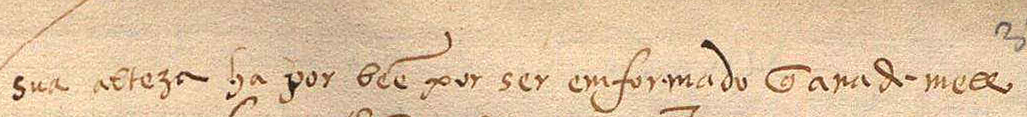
sua alteza ha por beē por ser emformado q̄ ana de mello
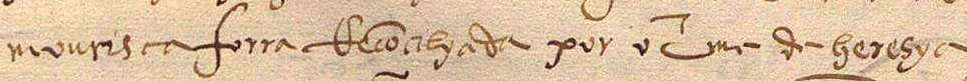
mourisca forra Rec̄ocilyada por o cime de heresya
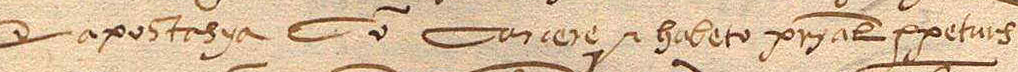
e apostasya Cō Carcere e habeto pn̄yaL ꝑpetuus
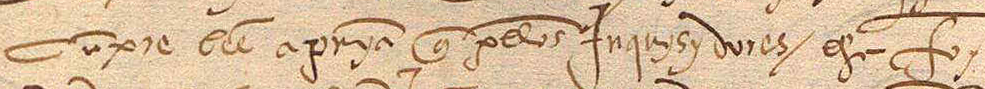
Cūpre beē a pn̄ya q̄ p̄llos Jnquysydores / lhe foy
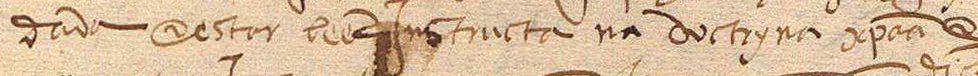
dada e estar beē Jnstructa na doctryna xp̄aa e
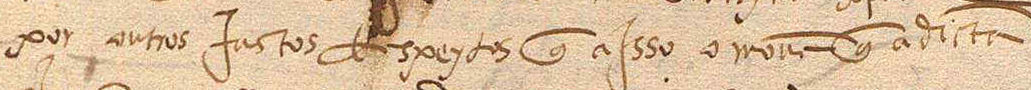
por outros Justos Respeytos q̄ a Jsso o moūe q̄ a dicta
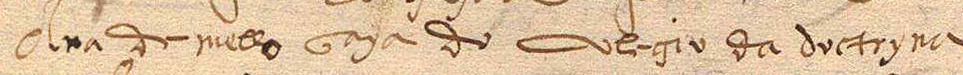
Ana de mello saya do Colegio da doctryna
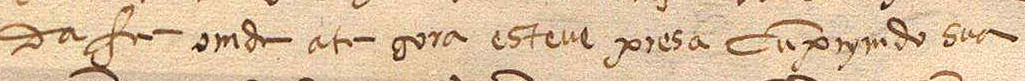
Da fee omde ate gora esteue presa Cūprymdo sua
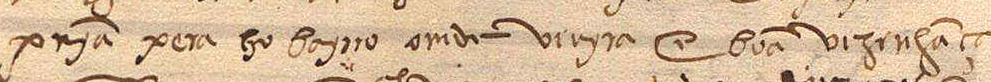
pnȳa pera ho bayrro omde viuyra ē bōa vizinhāça
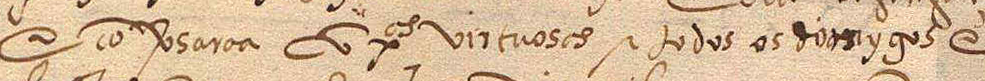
e c̄oꝟsaraa Cō pas virtuosas e todos os domygos e
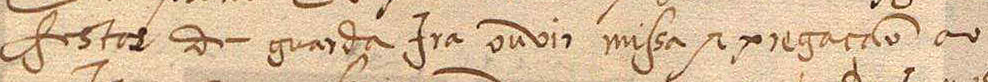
festas de guarda Jra ouvir missa e pregaçaõ ao
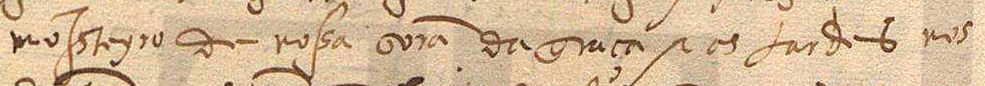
moJsteyro de nossa sor̄a da graça e as tardes nos
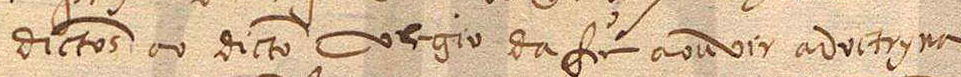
dictos ao dicto Colegio da fee a ouvir a doctryna
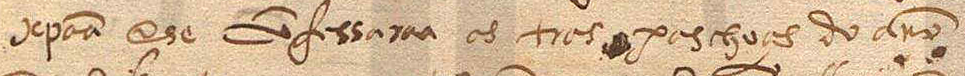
xpāa e se Cōfessaraa as tras paschoas do an̄o
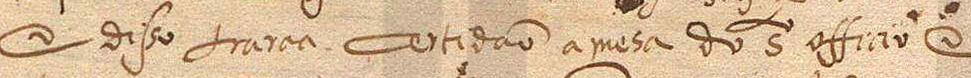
e disso traraa Certidaõ a mesa do sto officio e
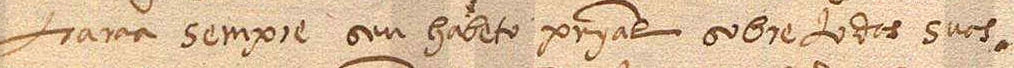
traraa sempre seu habeto pn̄yaL sobre todas suas
